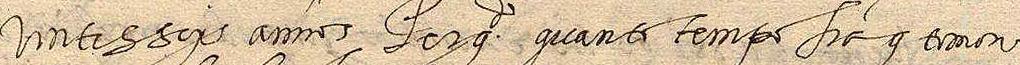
vinte E seys annos Perg.do quanto tempo ha q̄ tomou
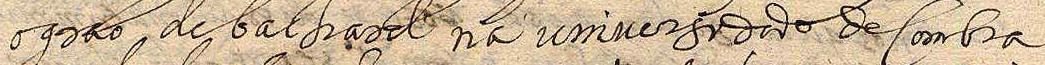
o grao de bacharel na uniuersidade de Coinbra
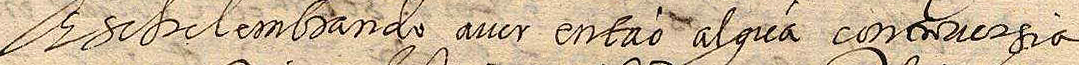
E se he lembrando auer entaõ alguā controuersia
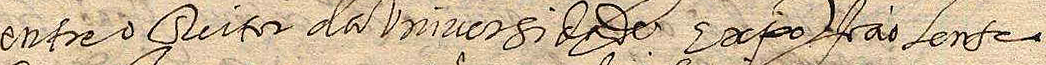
entre o Reitor da Vniuersidade E xpō Joaõ Lente
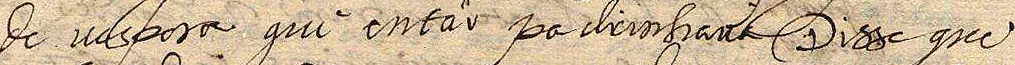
de uespora que entaõ padrinhaua Disse que
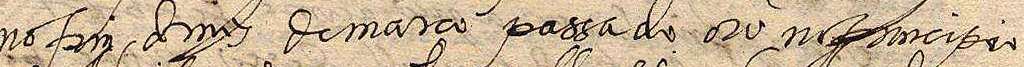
no fim do mes de março passado ou no principio
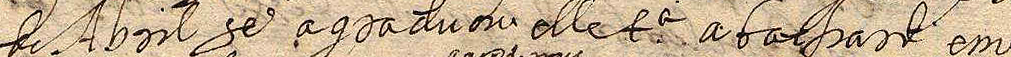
de Abril se agraduou elle t.a a bacharel em
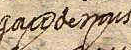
gaudemus
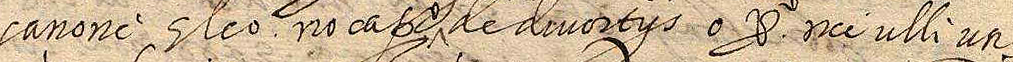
canone E leo no cap.o de diuortijs o ꝟ.o mi ulli un
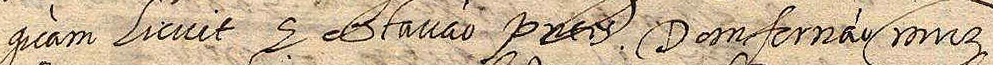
quam Licuit E estauão pntēs. Dom fernão m̄iz
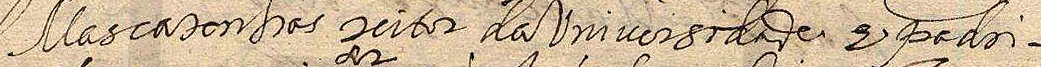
Mascarenhas reitor da Vniuersidade E padri
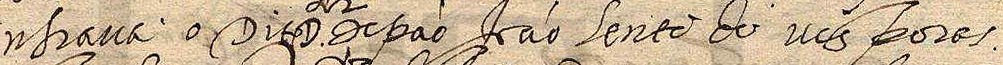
nhaua o Dito D.tor xpaõ João Lente de uesporas
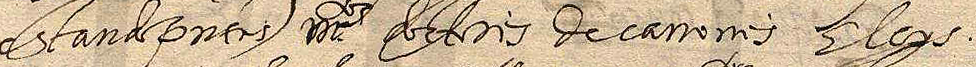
estando pntēs m.tos doctores de canones E leys
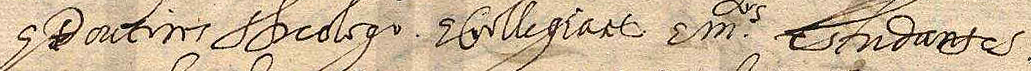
E Doutores theologo. E Collegiaes E m.tos estudantes
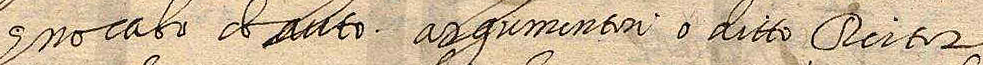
E no cabo do auto. argumentou o ditto Reitor
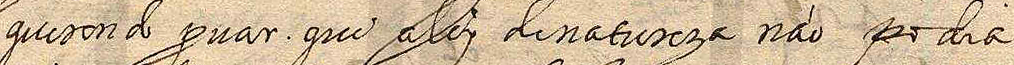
querendo ꝓuar. que a ley de natureza naõ podia
